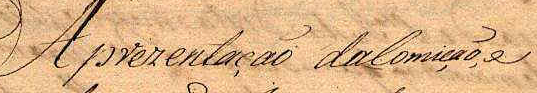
Aprezentaçaõ da Comiçaõ, e
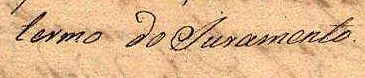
termo do Iuramento.
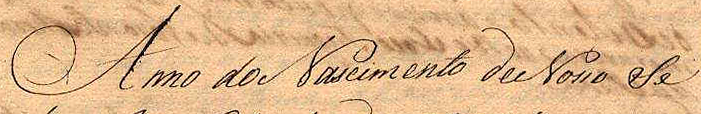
Anno do Nascimento de Nosso Se
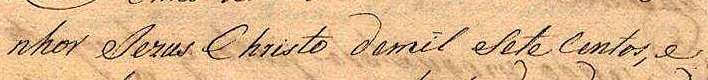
nhor Iezus Christo de mil Setecentos, e
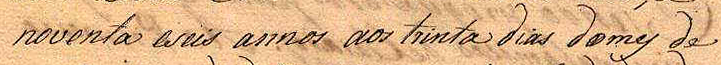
noventa e seis annos aos trinta dias do mes de
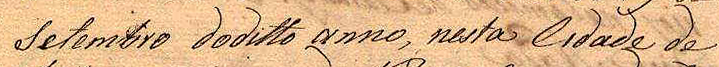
Setembro do ditto anno, nesta Cidade de
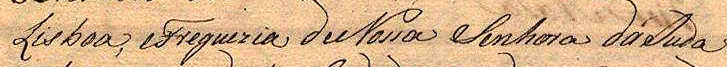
Lisboa, e Freguezia de Nossa Senhora daIuda
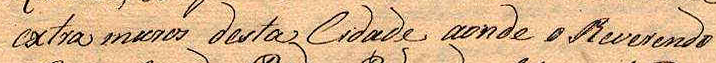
extramuros desta Cidade aonde o Reverendo
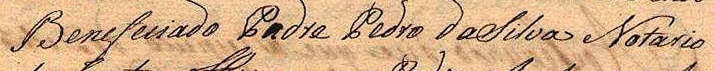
Benefeciado Padre Pedro da Silva Notario
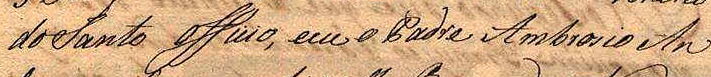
do Santo officio, e eu o Padre Ambrosio An
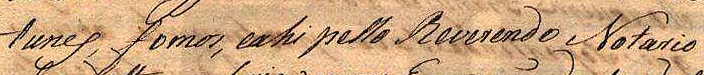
tunes, fomos, e ahi pello Reverendo Notario
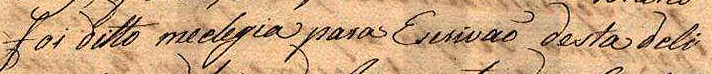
foi ditto me elegia para Escrivaõ desta deli
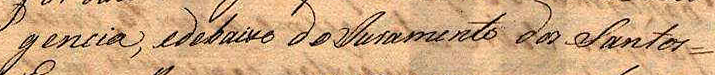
gencia, e debaixo do Iuramento dos Santos
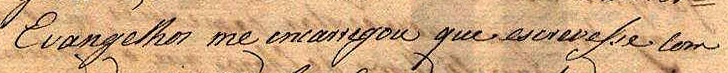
Evangelhos me encarregou que escrevesse com
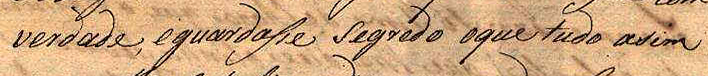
verdade, e guardasse segredo o que tudo asim
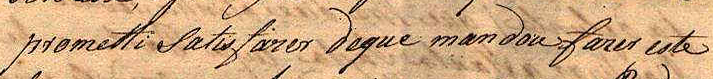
prometti satisfazer de que mandou fazer este
